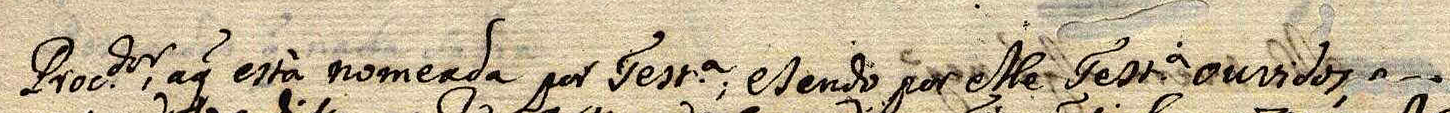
Proc.dor, a q̄ está nomeada por Test.a; e sendo por elle Test.a ouvidos
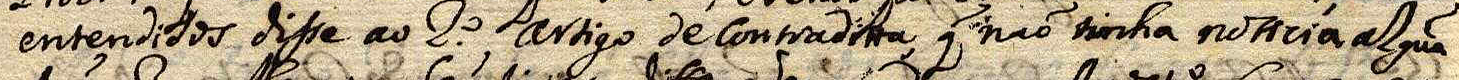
entendidos disse ao 2.o artigo de contraditta, q̄ naõ tinha noticia alguā
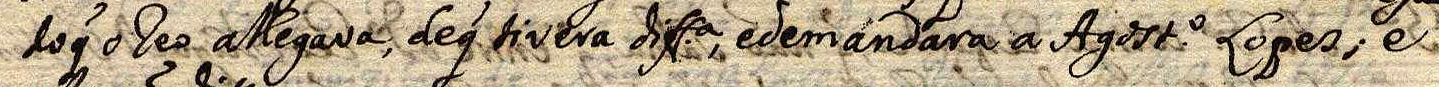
do q̄ o Reo allegava, de q̄ tivera diff.a, e demandara a Agost.o Lopes; e
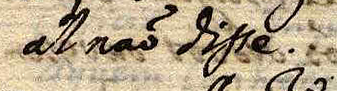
al naõ disse.
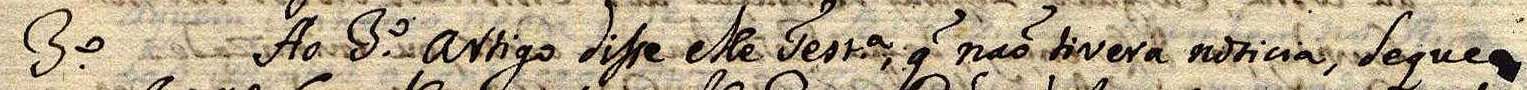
3.o Ao 3.o artigo disse elle Test.a, q̄ naõ tivera noticia, de que
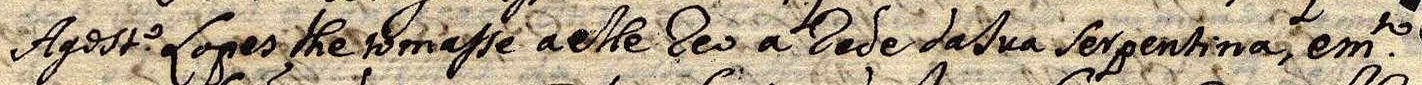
Agost.o Lopes, lhe tomasse a elle Reo a Rede da Sua serpentina, e m.to
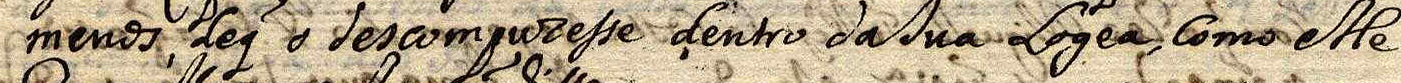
menos, de q̄ o descompuzesse dentro da sua Logea, como elle
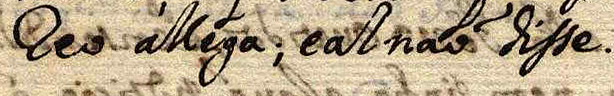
Reo allega; e al naõ disse.
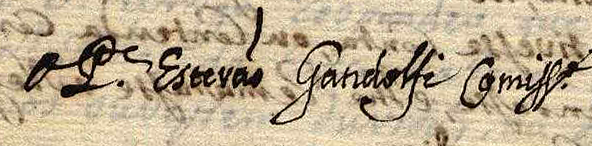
o P.e Estevão Gandolfi Comiss.o
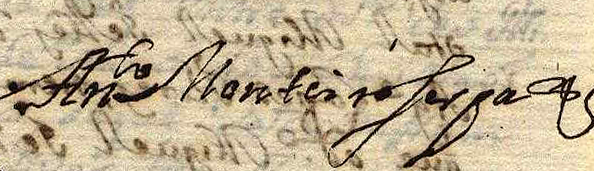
An.to Monteiro serpa
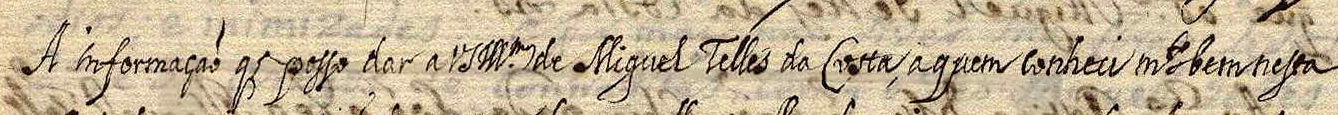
A informaçaõ q̄ posso dar a VSIll.as de Miguel Telles da Costa, a quem conheci mto bem nesta
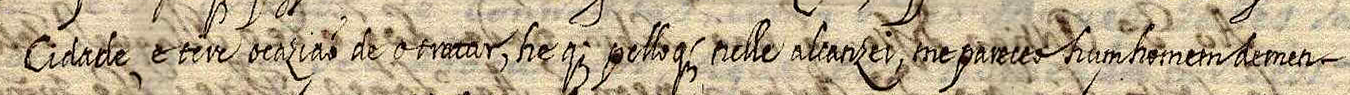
Cidade, e tive ocaziaõ de o tratar, he q pello q̄ nelle alcanzei, me pareceo hum homem demen
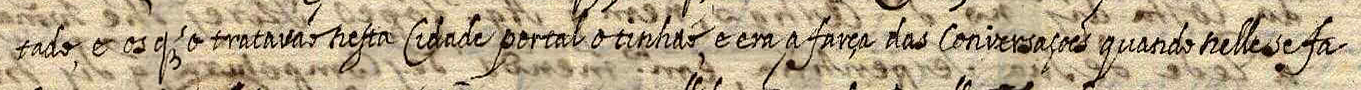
tado, e os q̄ o tratarão nesta Cidade por tal o tinhaõ, e era a farça das conversaçoẽs quando nelle se fa
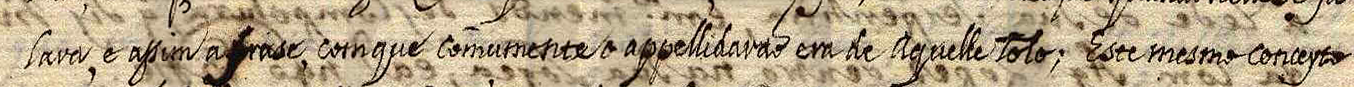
lava, e assim a frase, com que com̄umente o appelledaraõ era de aquelle tolo; Este mesmo conceyto
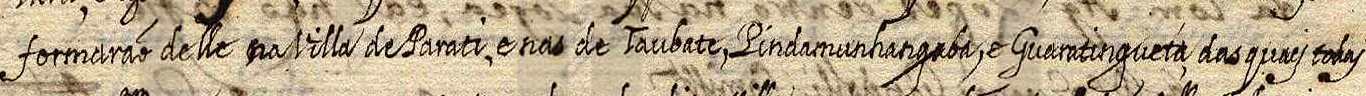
formaraõ delle na Villa de Parati, e nas de Taubate, Pindamunhangaba, e Guaratingueta, das quais todas
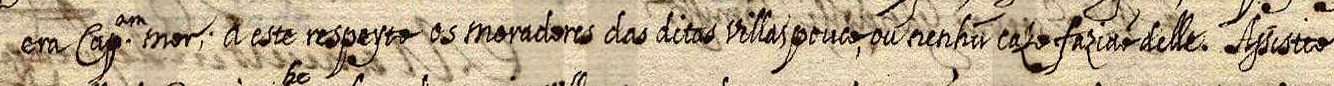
era Cap.am mor; a este respeyto os moradores das ditas Villas pouco ou nenhū caso faziaõ delle. Assistio
